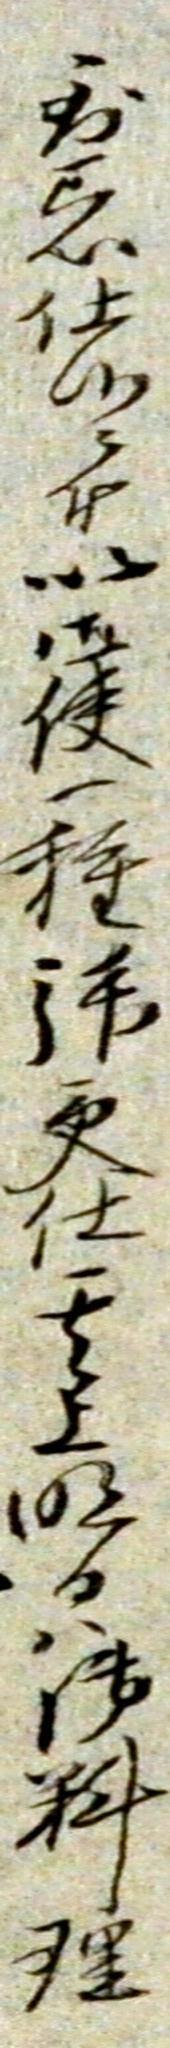到着仕候ニ付以御使一種拝受仕其上明日ㇵ御料理
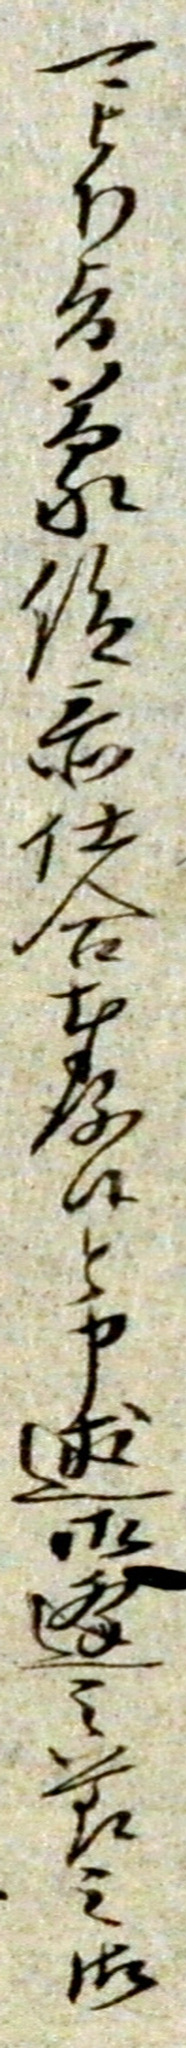可ヒ下旨蒙仰忝仕合奉存候と申述御逢之節之御
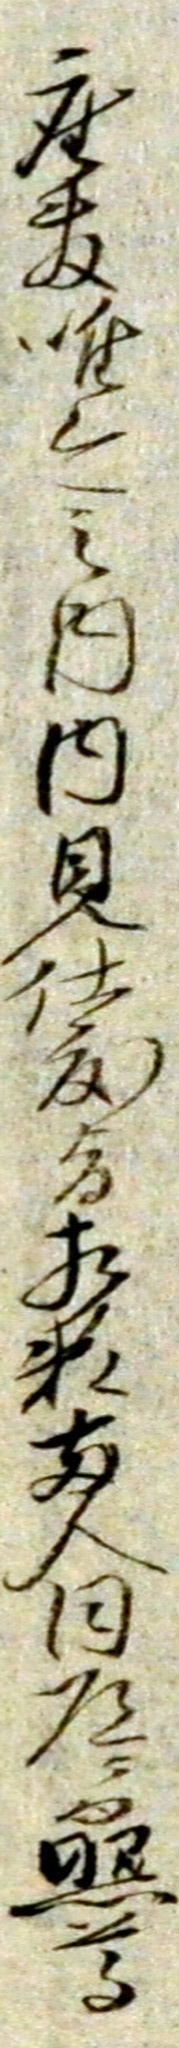座敷唯今之内内見仕度旨相頼両人同道ニ而照尊院も
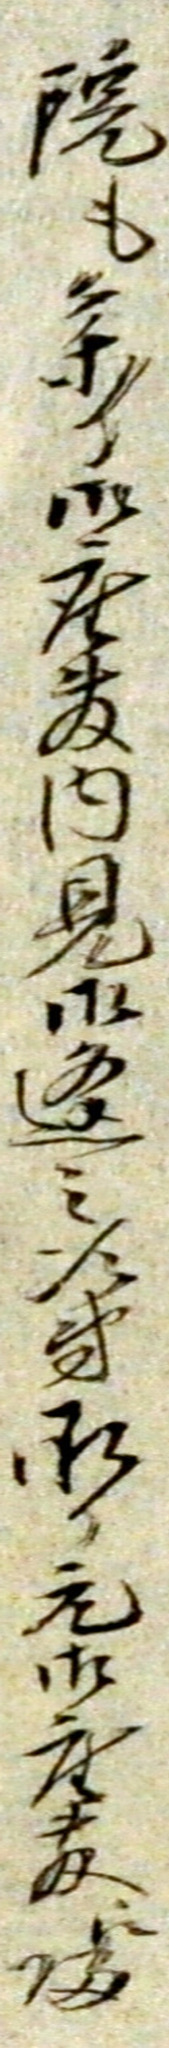参り御座敷内見御逢之次第承り元御座敷江帰座
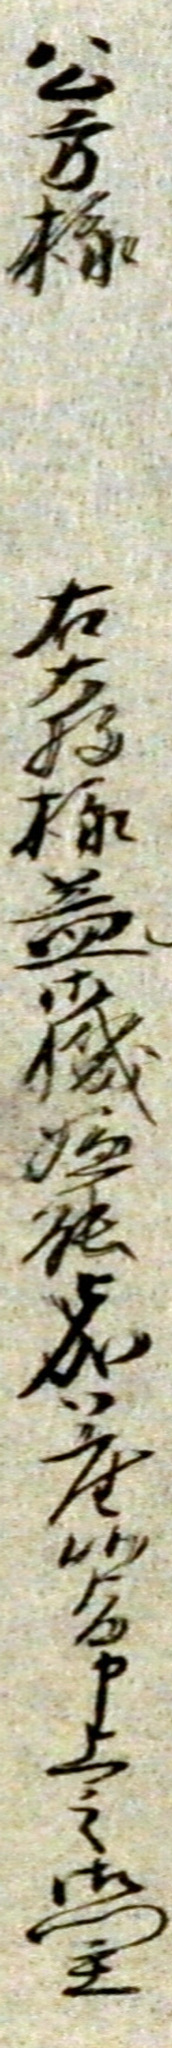公方様右大将様益御機嫌能ヒ成御座候旨申上之御門主
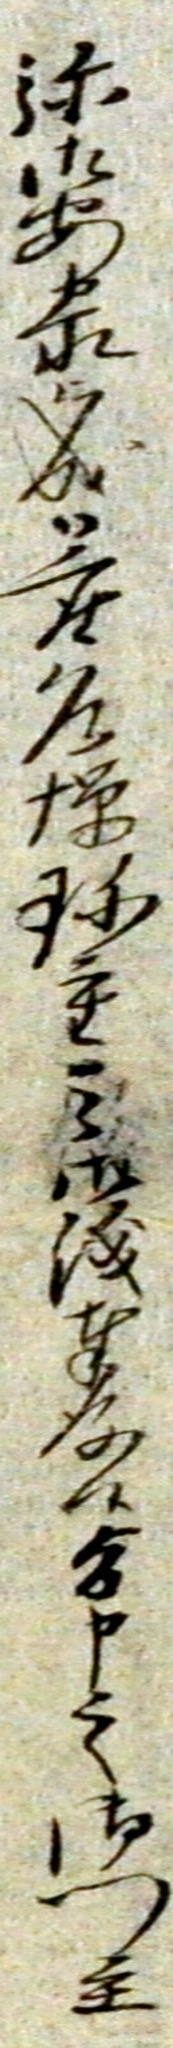弥御安泰ㇶ成御座乍恐珍重之御儀奉存候旨申之御門主
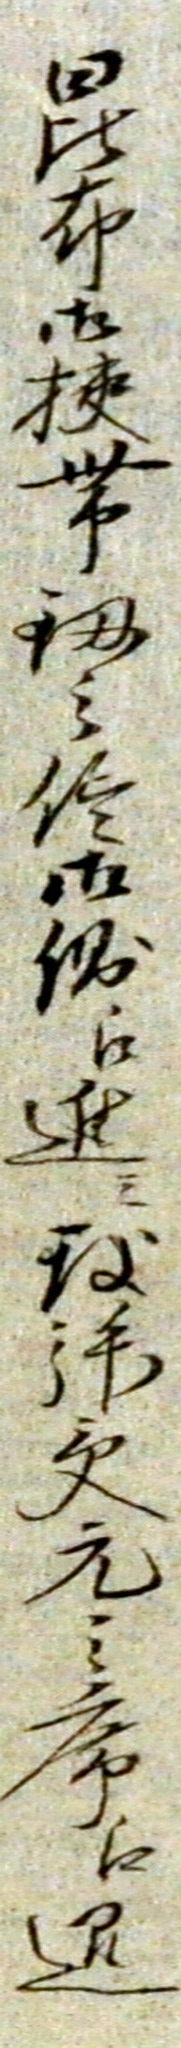同所布御挟帯劔之儘御側江進ミ致拝受元之席江退
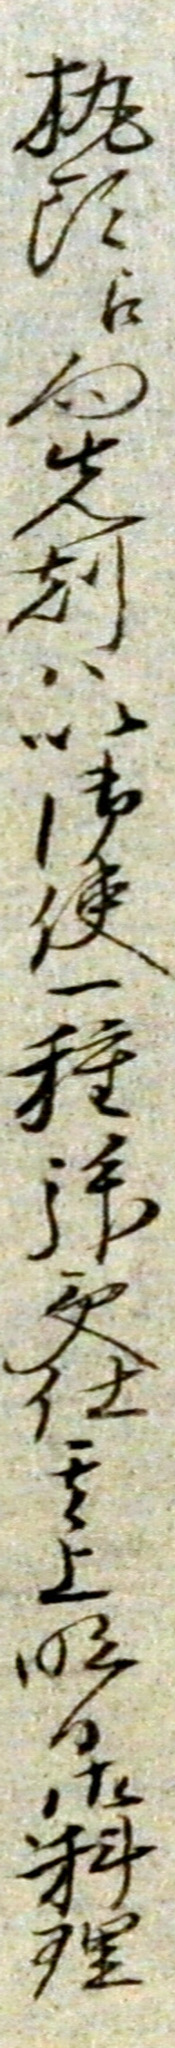執頭江向先刻ㇵ以御使一種拝受仕其上明日御料理
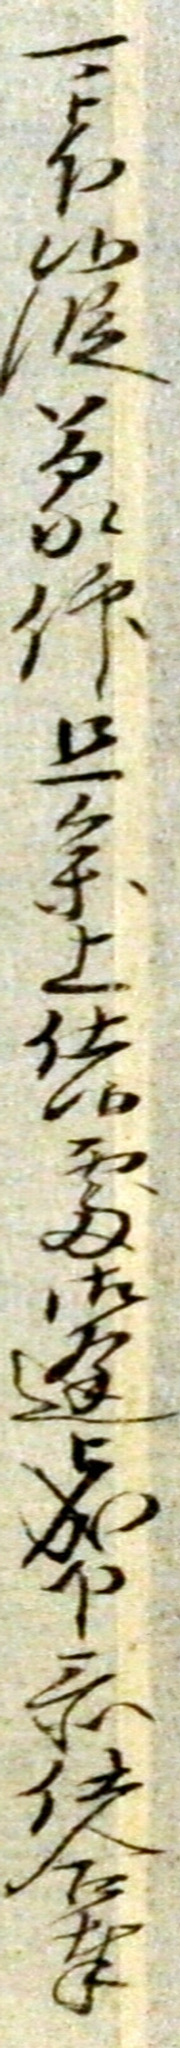可ヒ下候段蒙仰且参上仕候處御逢ヒ成下忝仕合奉
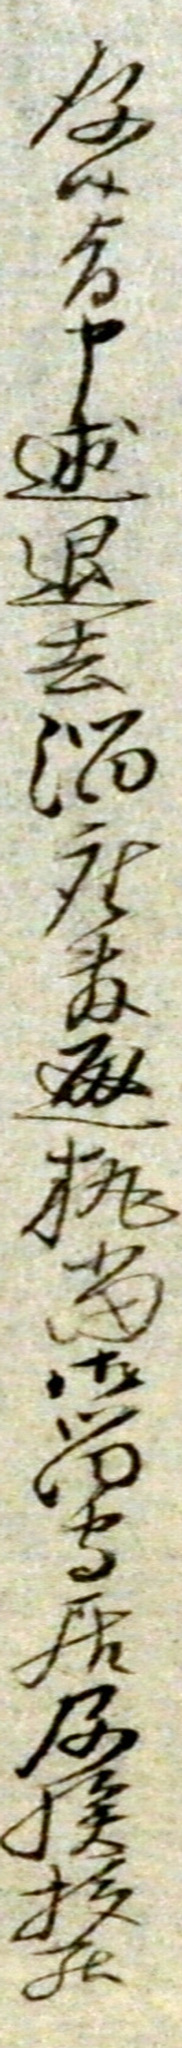存候旨申述退去溜座敷通執当御留守居及挨拶罷
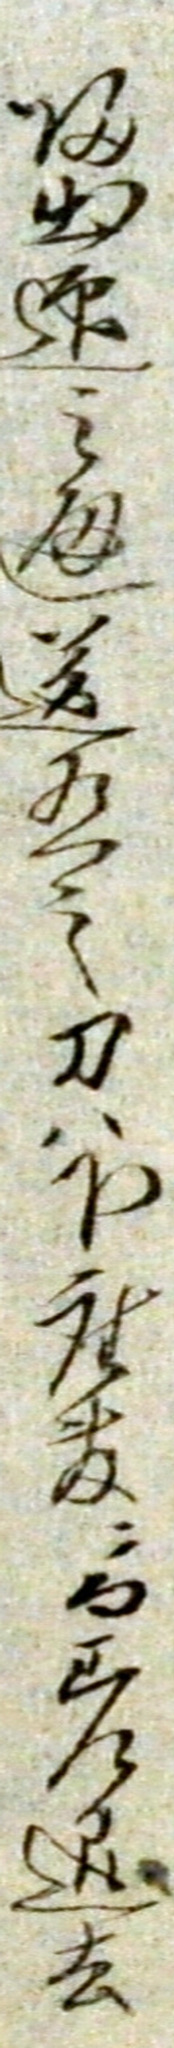帰出迎之通送有之刀ハ下座敷ニ而差退去
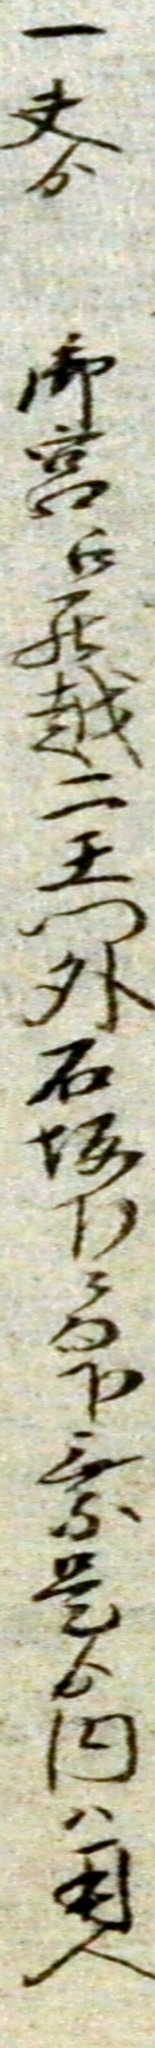一夫ゟ御宮江罷越二王門外石坂下ニ而下乗是ゟ内ㇵ用人
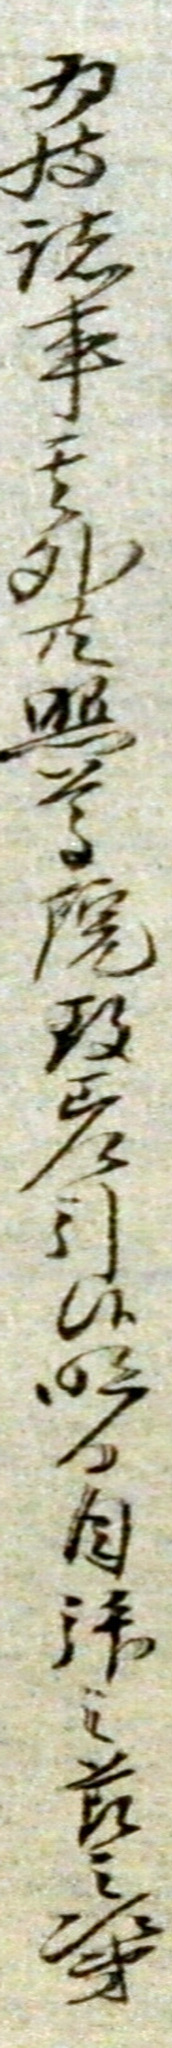刀取刀番二為持諸事其外共照尊院致差引候明日自弥之節之
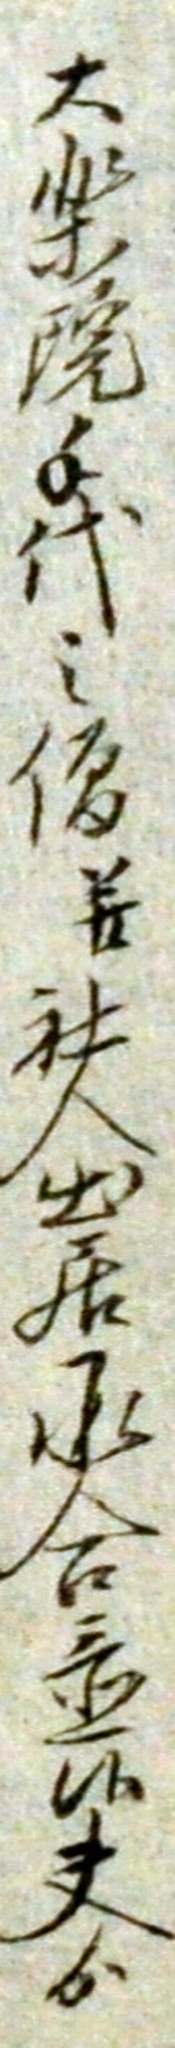次第大楽院手代之僧幷社人出居承合置候夫ゟ
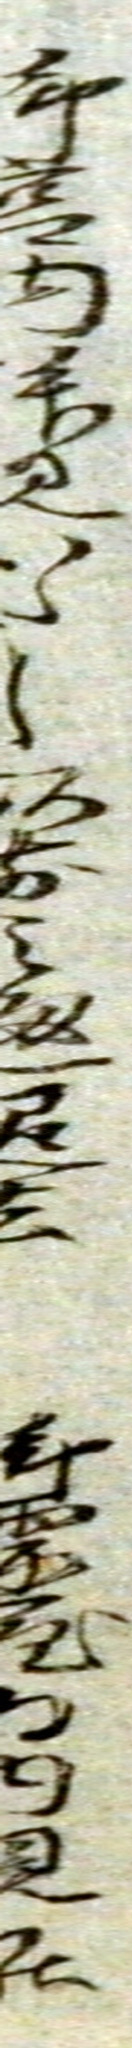御宮内拝見いたし以前之通退去御霊屋為内見罷

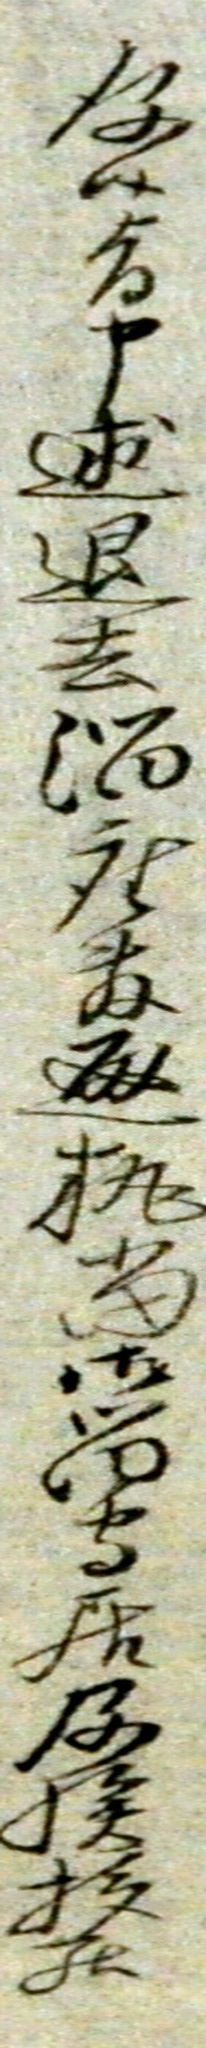存候旨申述退去溜座敷通執當御留守居及挨拶罷帰
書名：日光御名代相勤候節ノ留
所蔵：伊那市立高遠町図書館・合同会社AMANE
